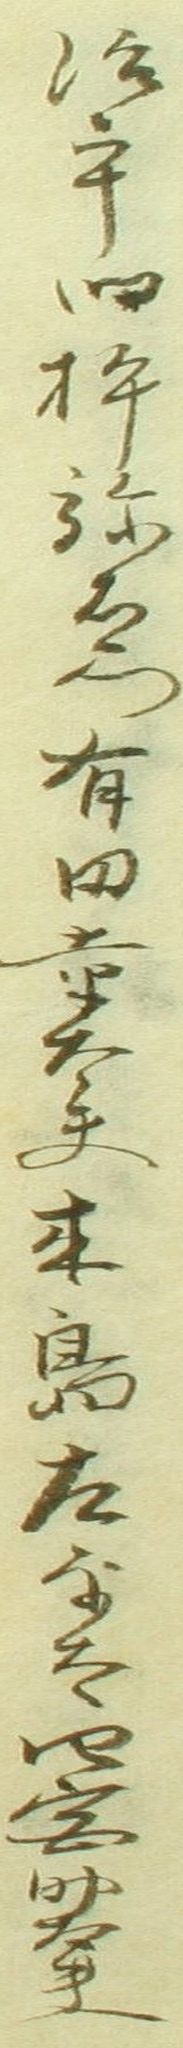治平臼杵弥右衛門有田幸太夫来島左平太四宮助太夫
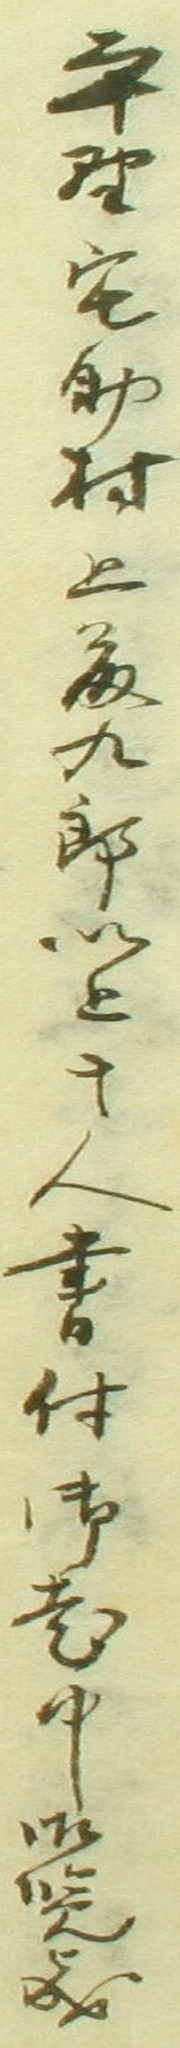平野宅助村上藤九郎以上十人書付御老中御覧被成
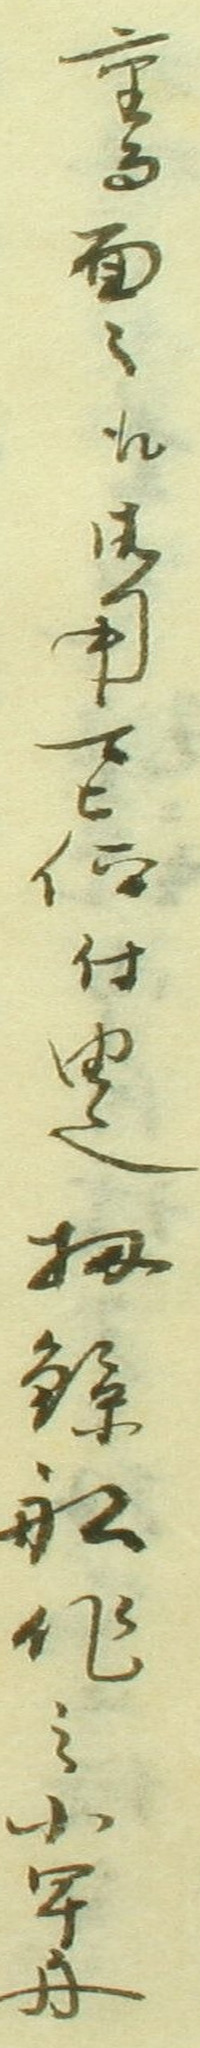重而面々江御用可被仰付由也扨鯨船作之小早舟
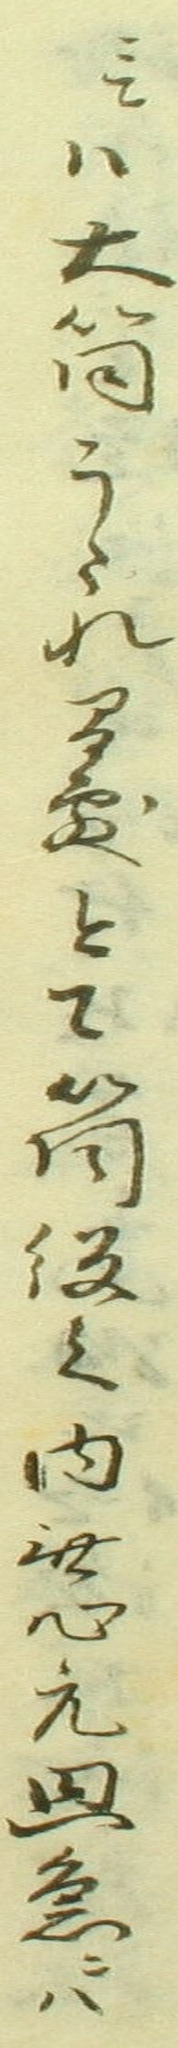にては大筒うたれ間敷とて筒役之内無心元思急には
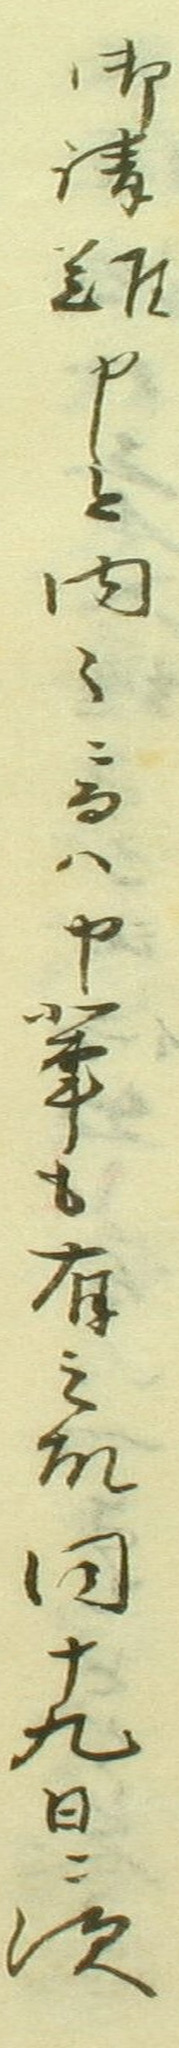御請難申と内々に而は申輩も有之故同十九日ニ須
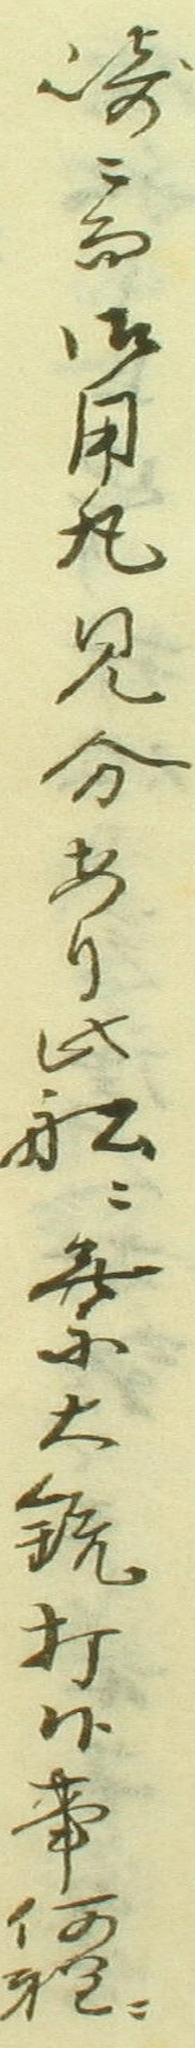崎ニ而御用丸見分あり此船に乗大銃打候事何程ニ
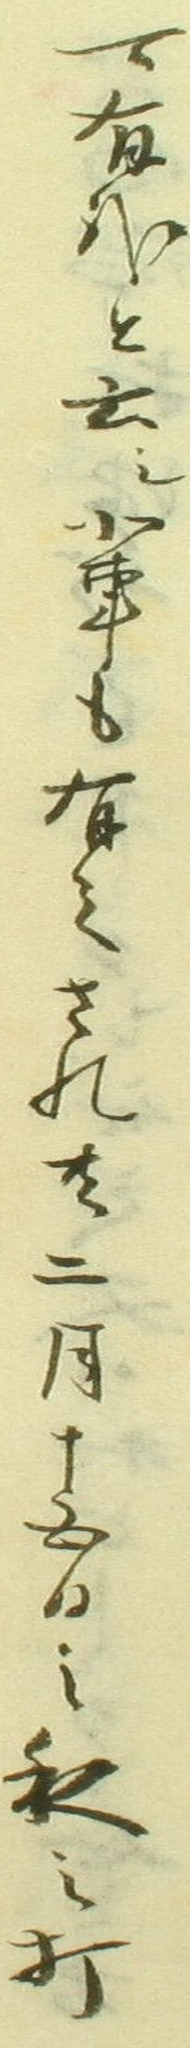可有哉と云シ輩も有之され共二月十五日之夜之打
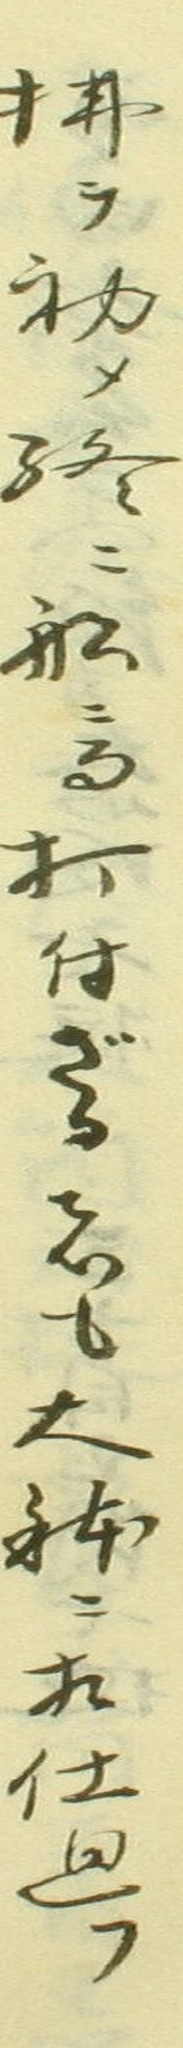払ヲ初メ終ニ船ニ而打付ざる者も大体ニ相仕思フ
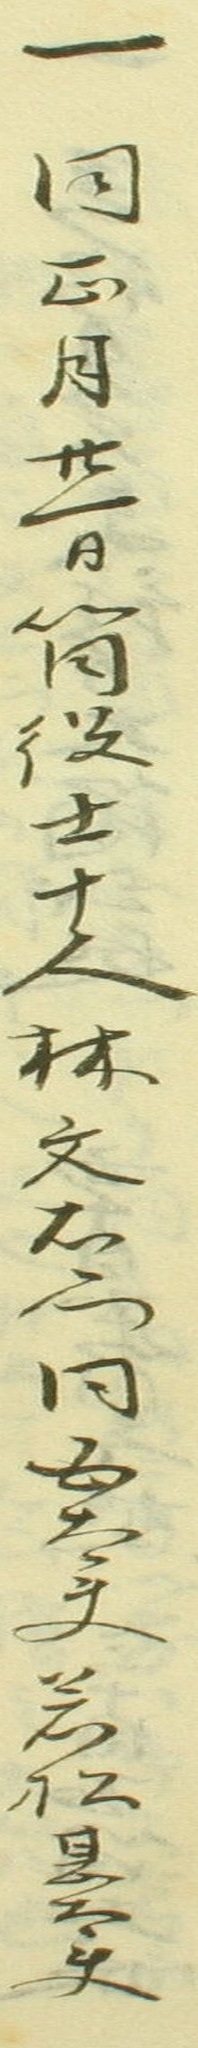一同正月廿一日筒役士十人林文右衛門同五太夫若松甚太夫
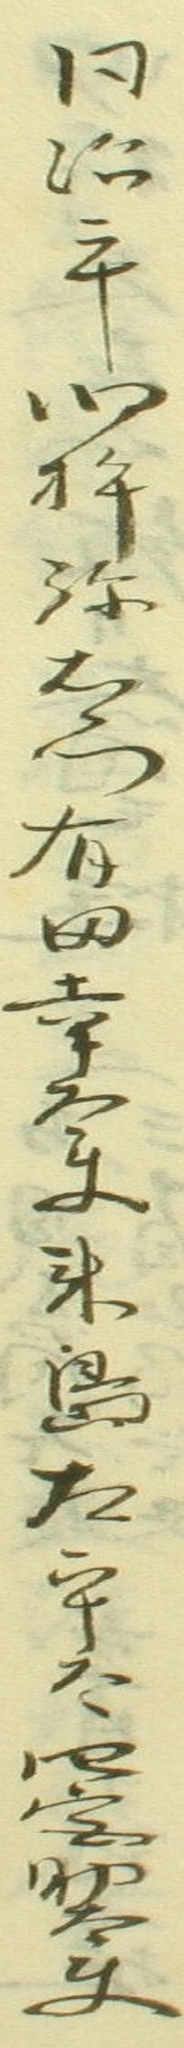同治平臼杵弥右衛門有田幸太夫来島左平太四宮助太夫
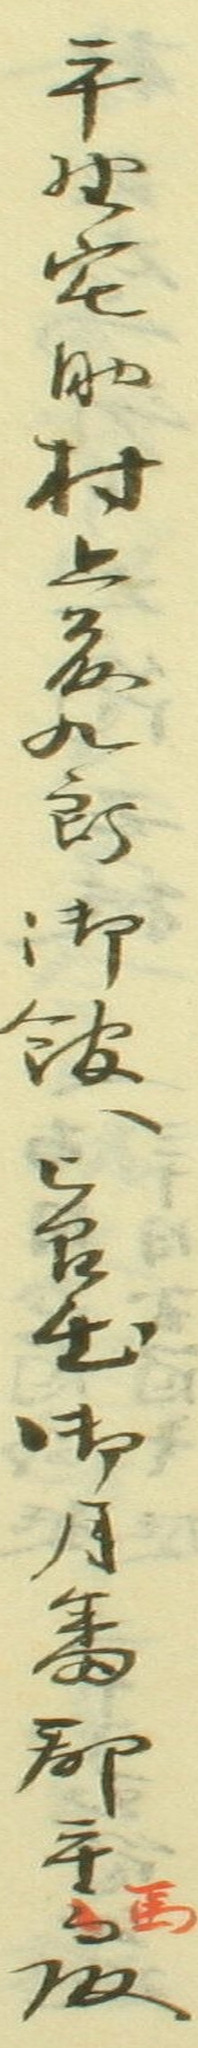平野宅助村上藤九郎御館へ被召出御月番郡平馬殿
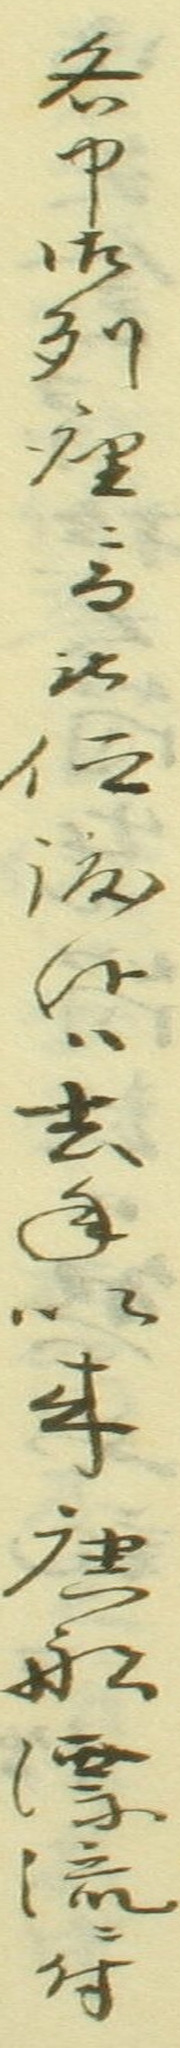各申御列座ニ而被仰渡候は去年以来唐船漂流ニ付
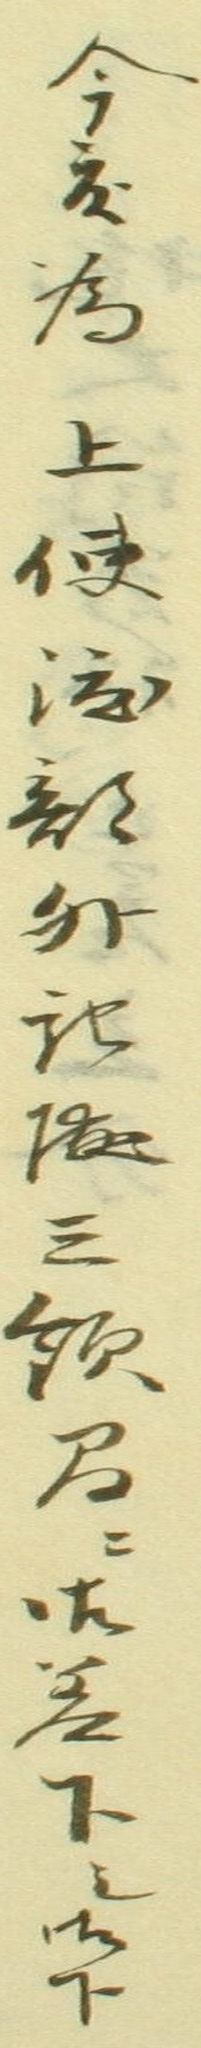今度為上使渡部外記殿三領間ニ御差下し御下
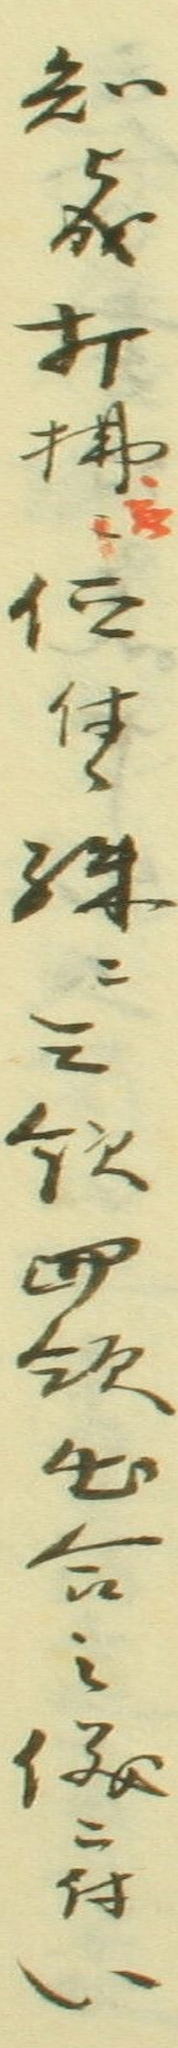知被成打払被仰付候殊ニ三領四領出合之儀ニ付い
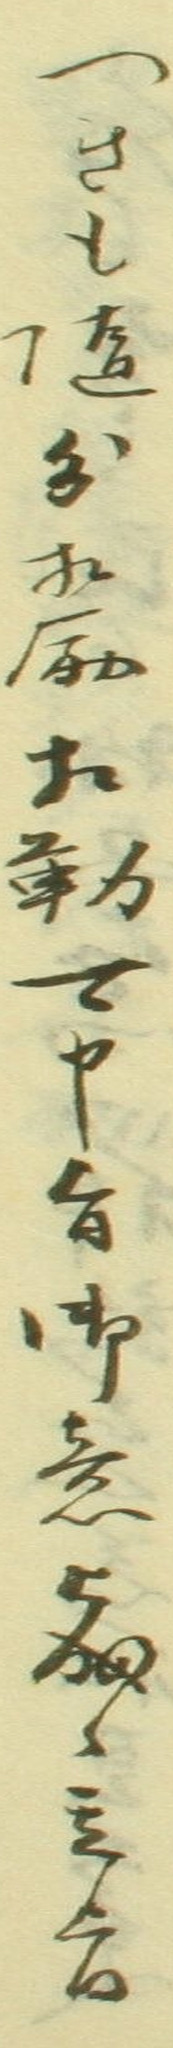つれも随分相励相勤可申旨御意被成候其旨
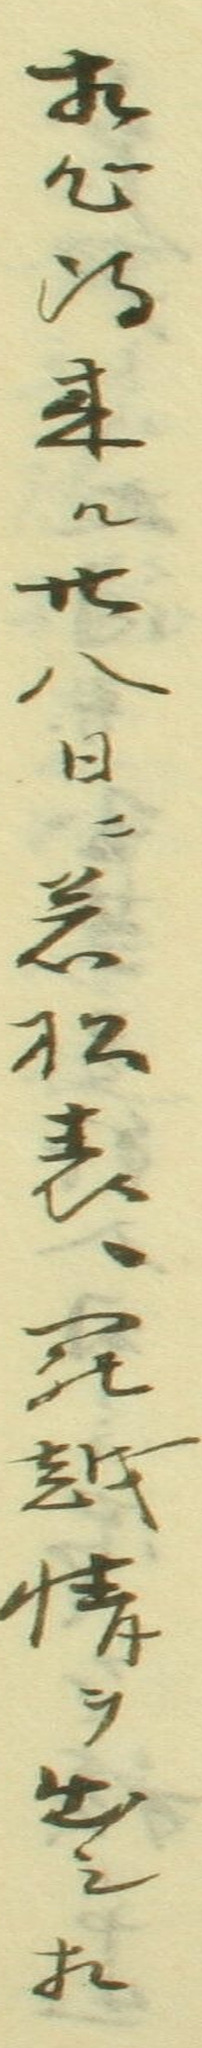相心得来ル廿八日ニ若松表へ罷越情ヲ出シ相
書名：唐船漂流記 二
